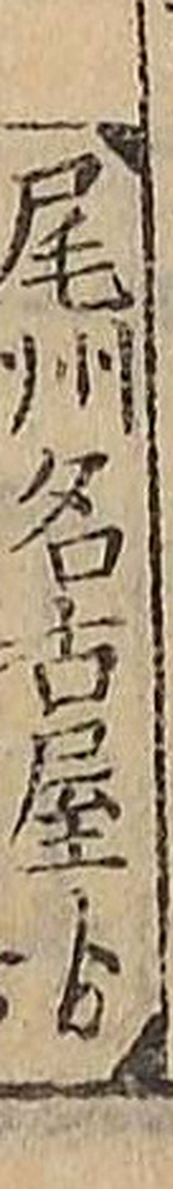尾州名古屋ゟ
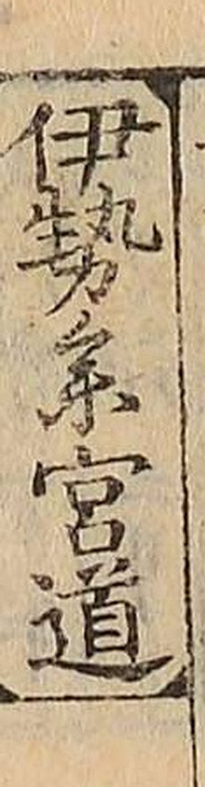伊勢参宮道
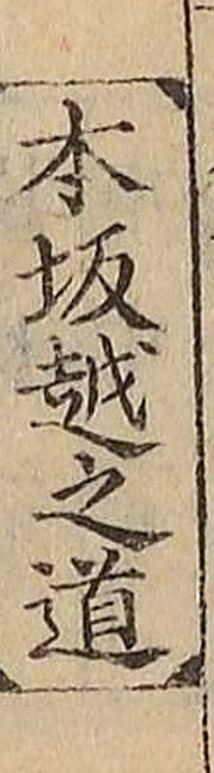本坂越之道
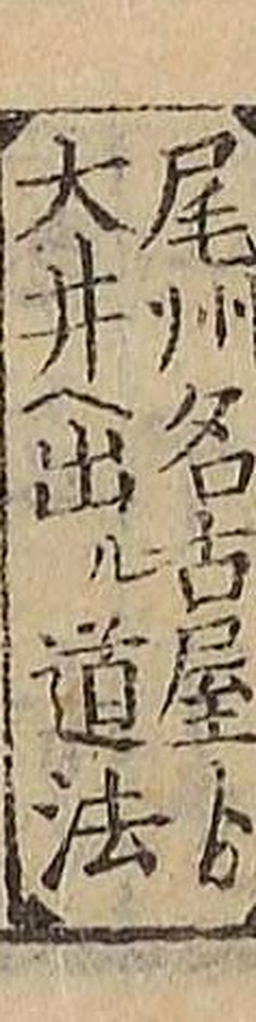大井へ出道法
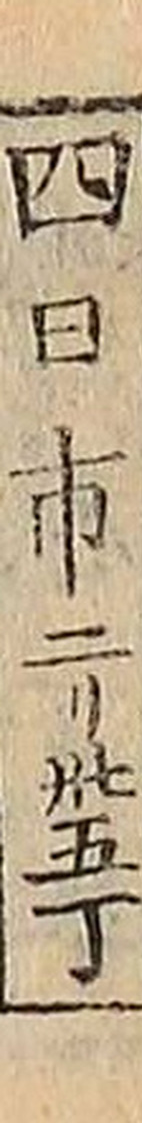四日市二リ卅五丁
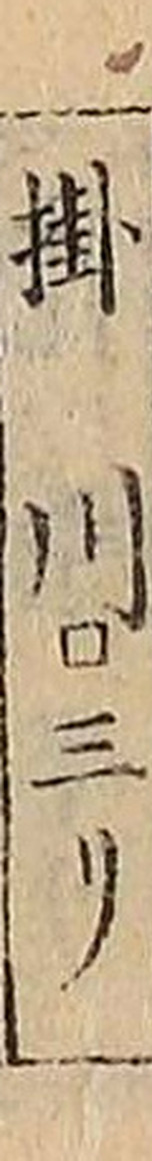掛川▫三リ
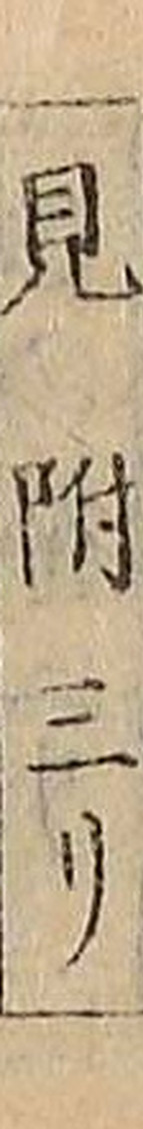見附三リ
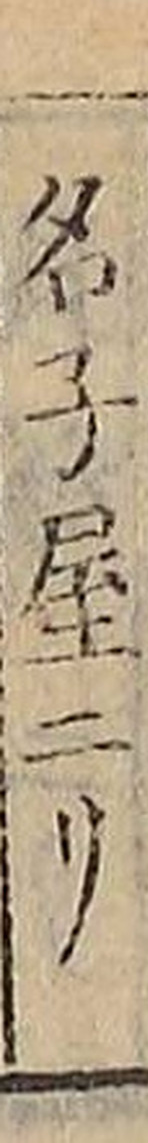名子屋二リ
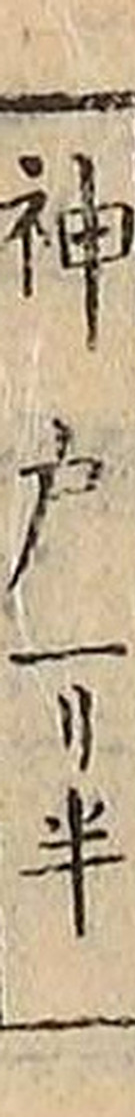神戸一リ半
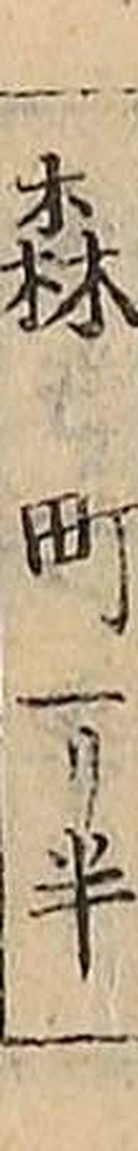森町一リ半
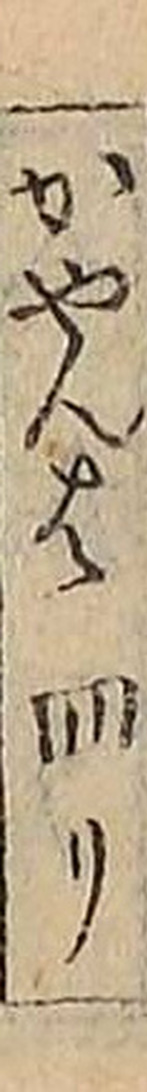かやんは四リ
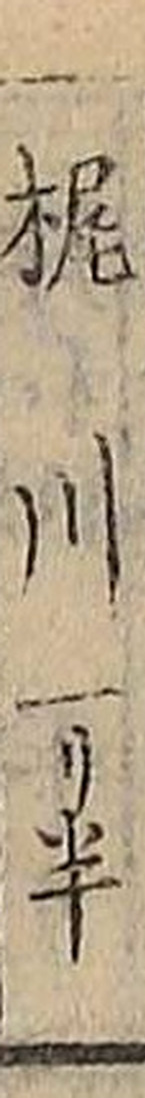梶川一リ半
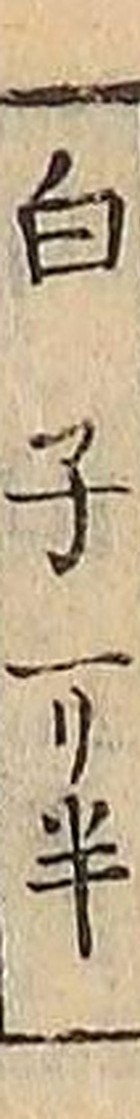白子一リ半
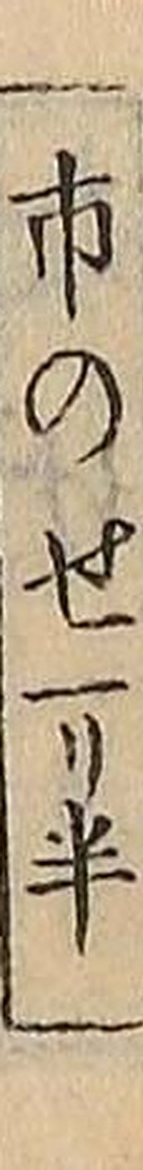市のせ一リ半
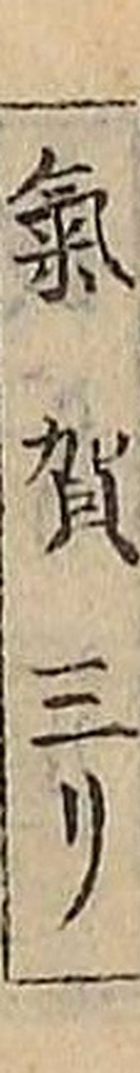気賀三リ
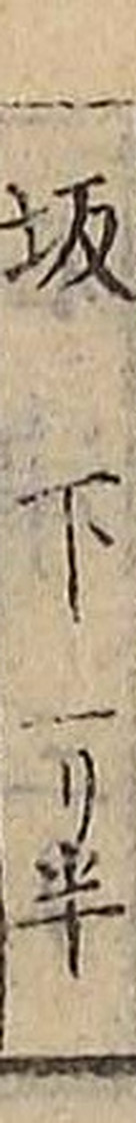坂下一リ半
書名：旅行用心集
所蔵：神戸大学附属図書館 国文学研究資料館
